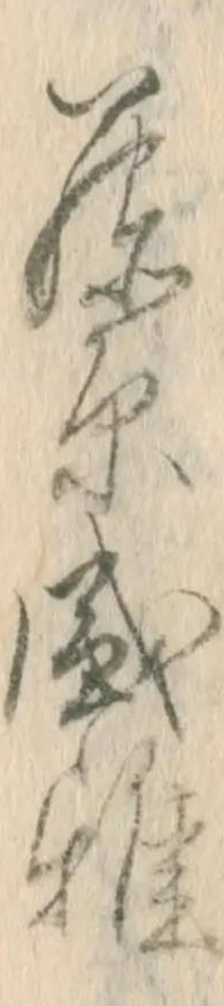藤原盛雅

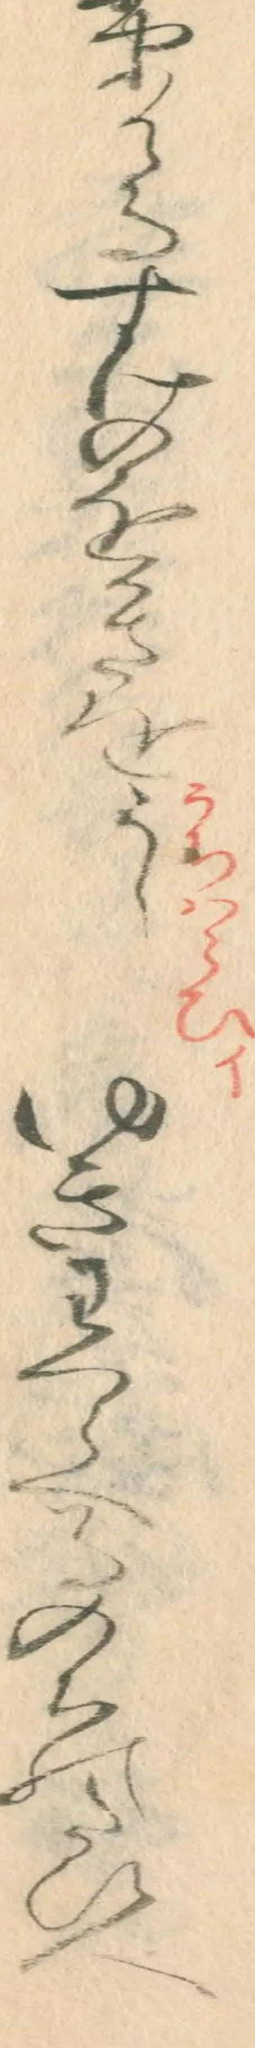ふりかゝるすけのをかさをうしゆきわつらへるのちのたひ人
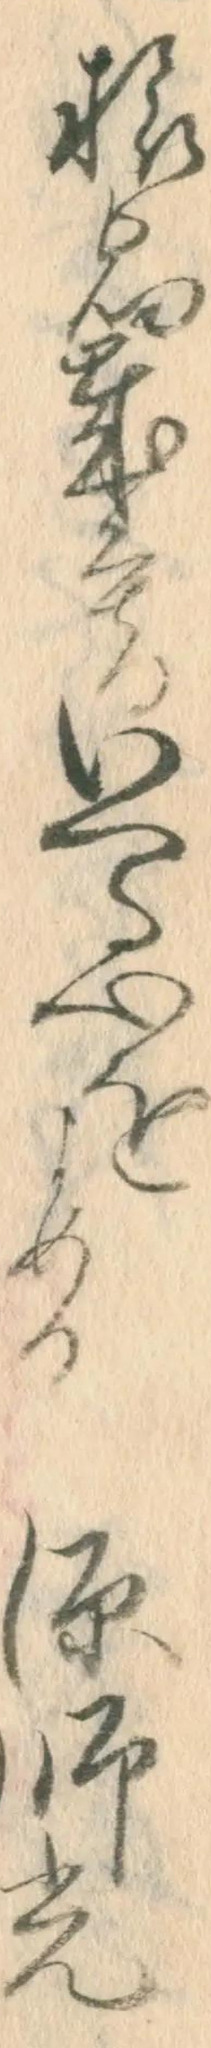旅宿歳暮いへる心をよめる源師光
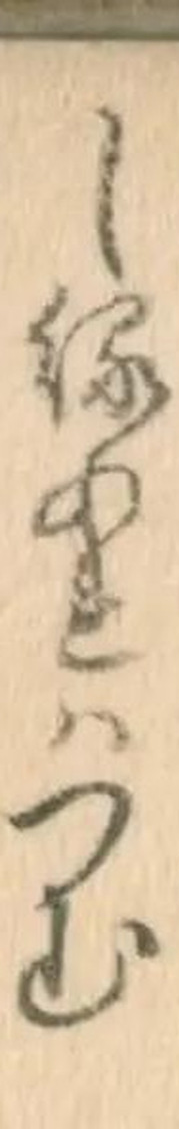し縁あれはつむ
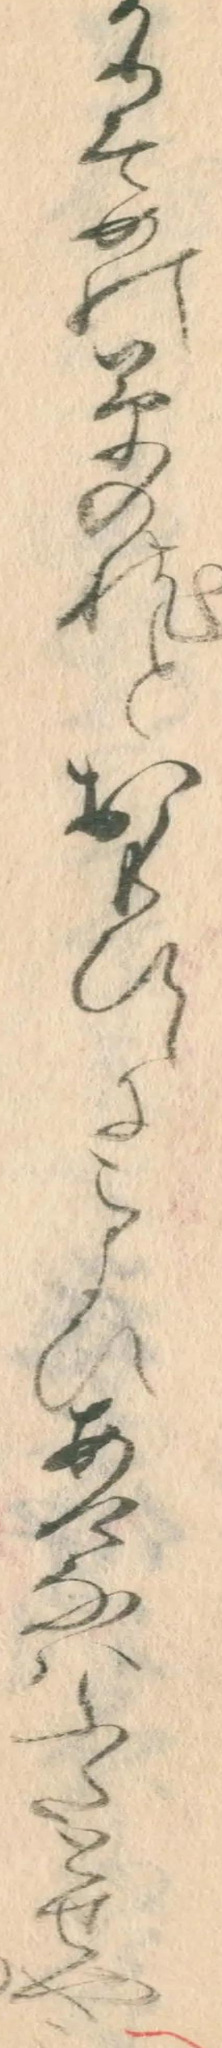かりそめの草の枕とおもひしにこよひあけなはふたとせやらむ
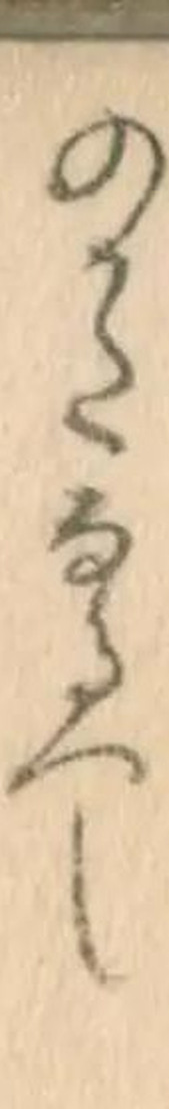のかたなるへし
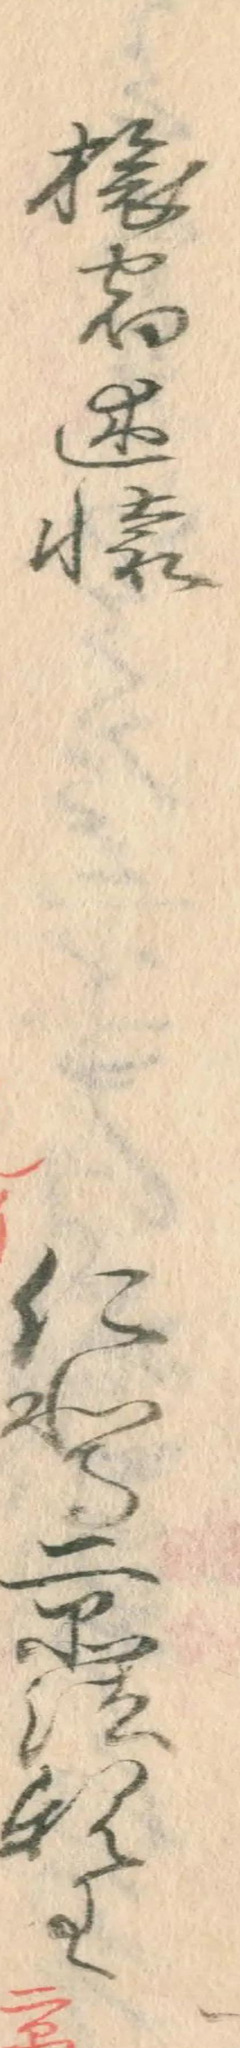旅宿述懐仁和寺二品法親王
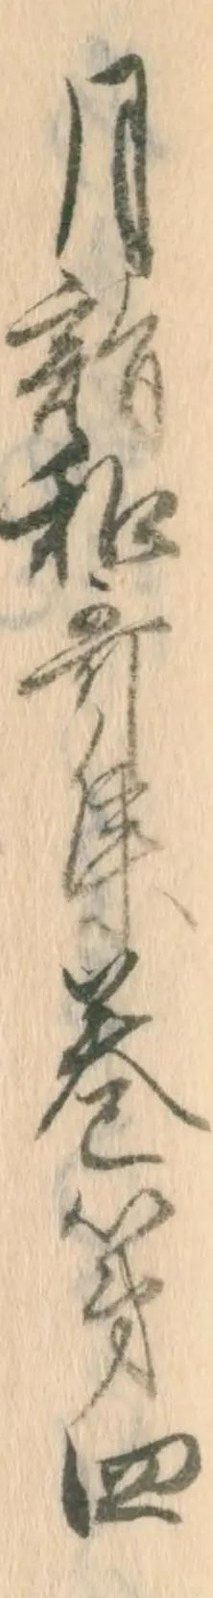月詣和歌集巻第四
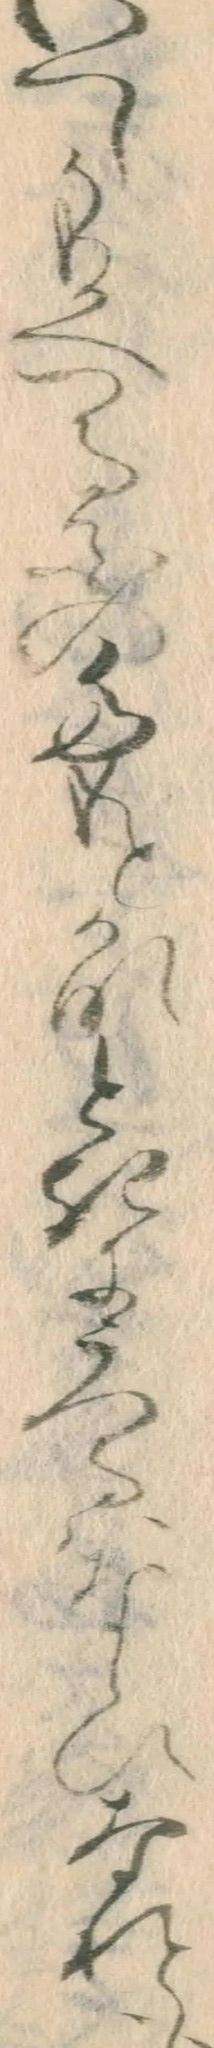いつしかもかへつる花のたもとかなときにうつるはならひなれとも
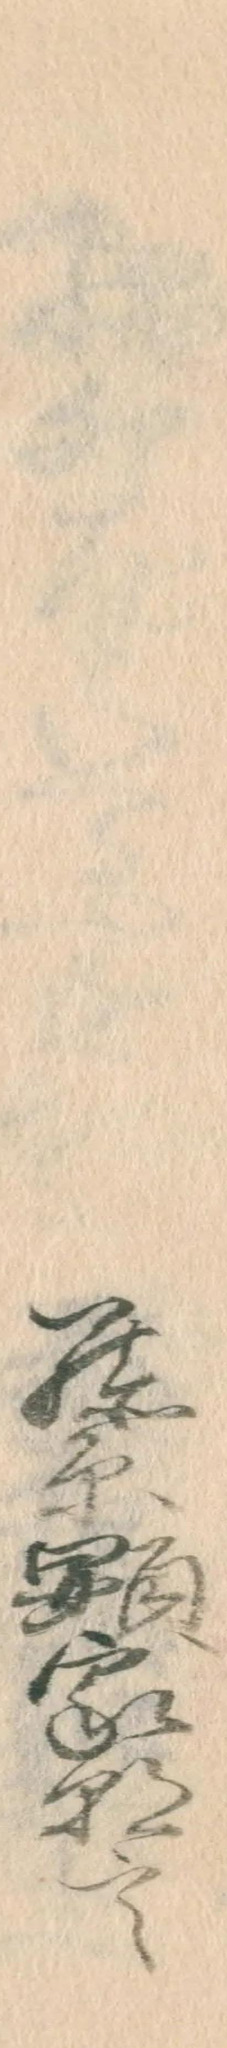藤原顕家朝臣
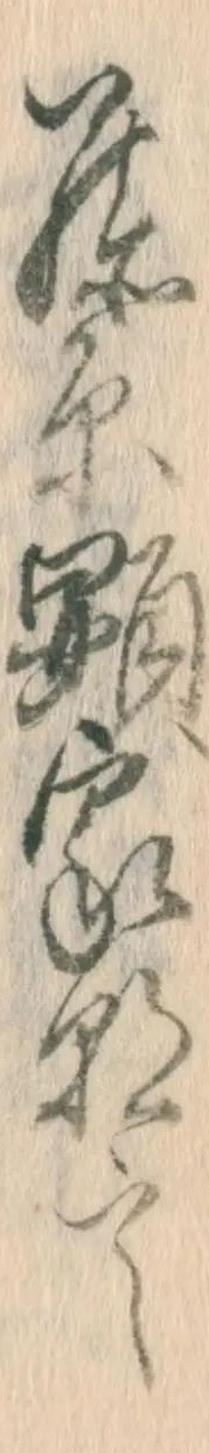藤原顕家朝臣
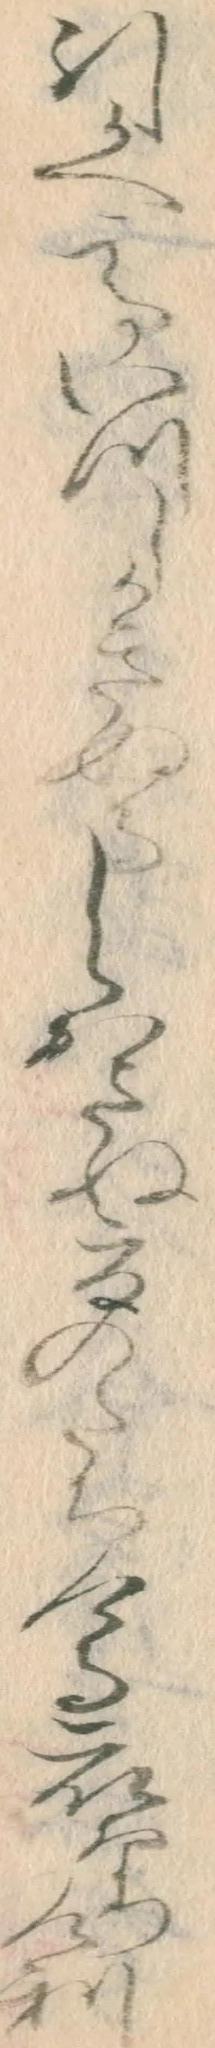引かへていつしかきぬるしらかさね夏のたちける衣なりけり
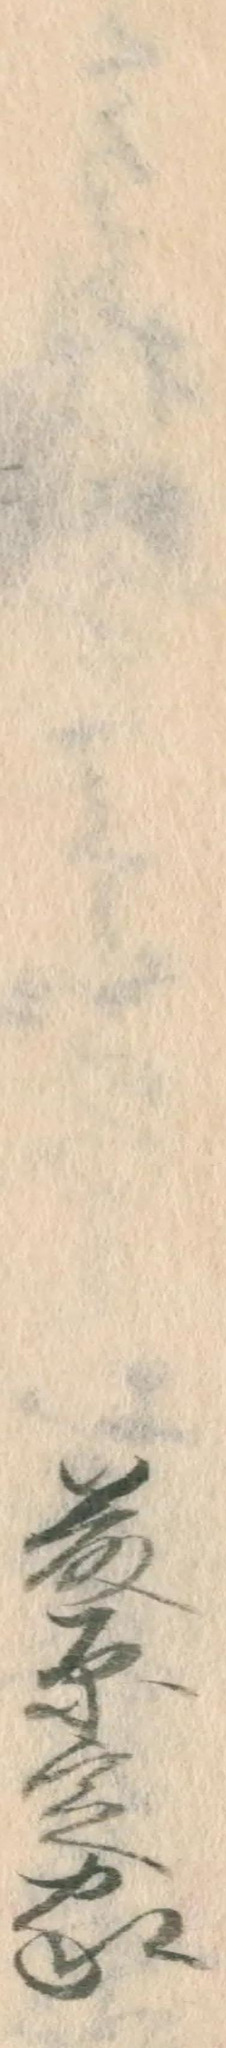藤原定家
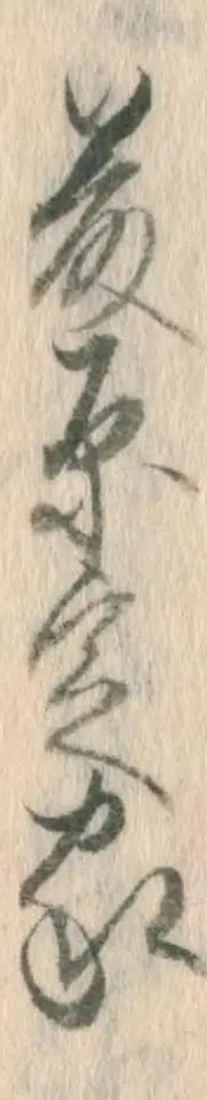藤原定家
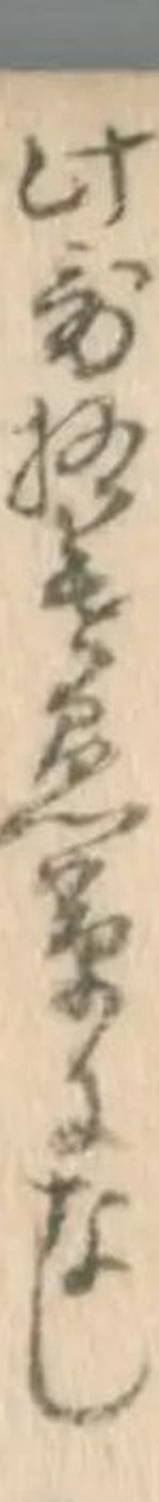此歌拾遺愚草になし
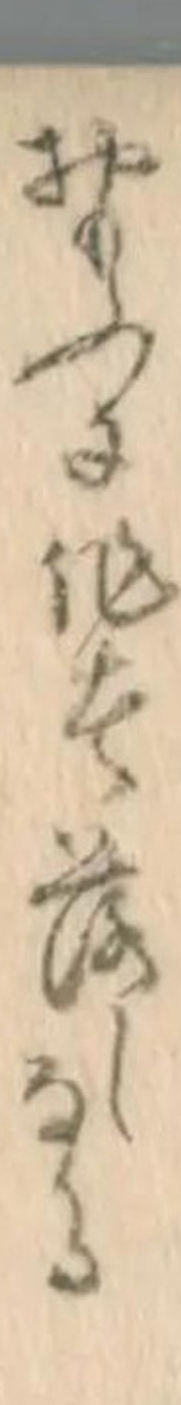おもふに作者落しなる
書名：月詣和歌集
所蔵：国立国会図書館 National Diet Library, JAPAN
